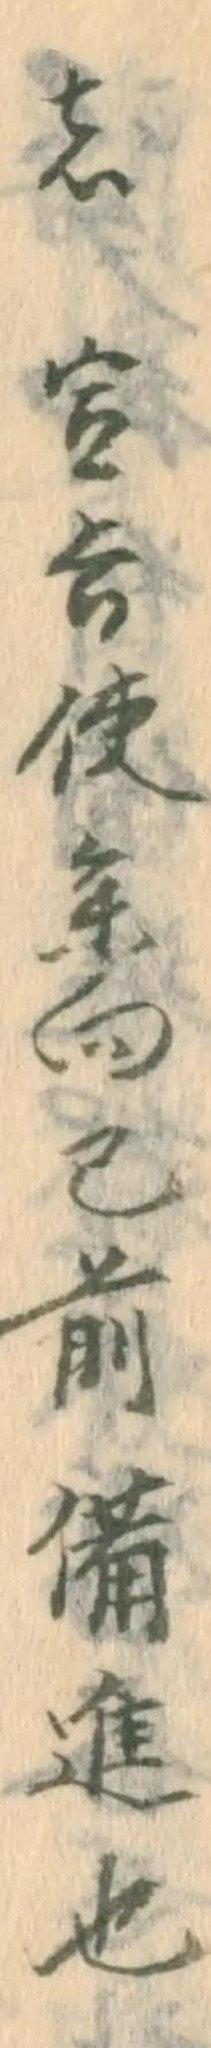は宣旨使参向巳前備進也
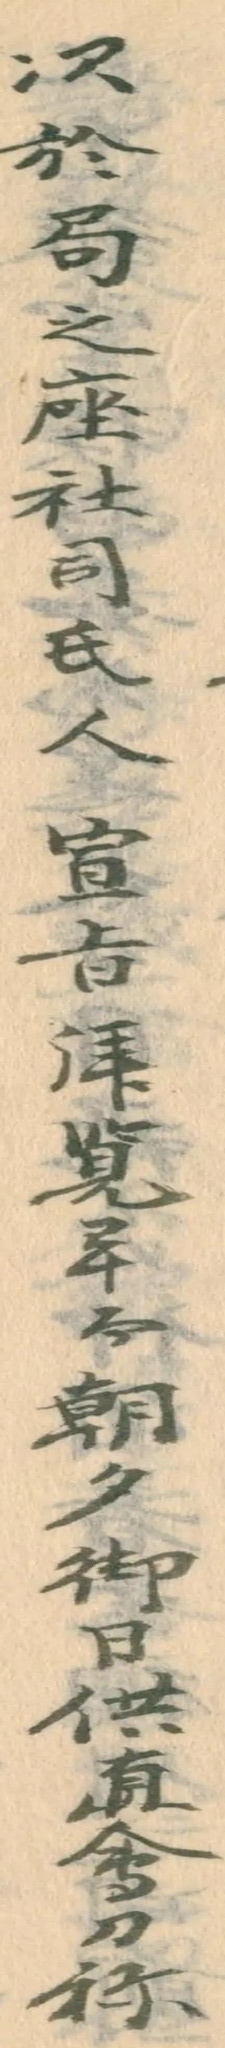次於局之座社司氏人宣旨拝覧畢而朝夕御日供直会刀祢
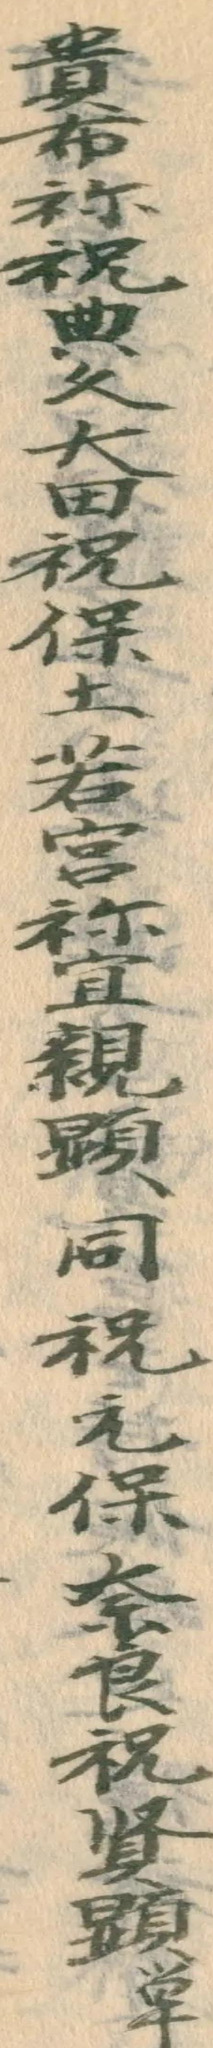貴布祢祝典久大田祝保土若宮祢宜親顕同祝元保奈良祝賢顕単
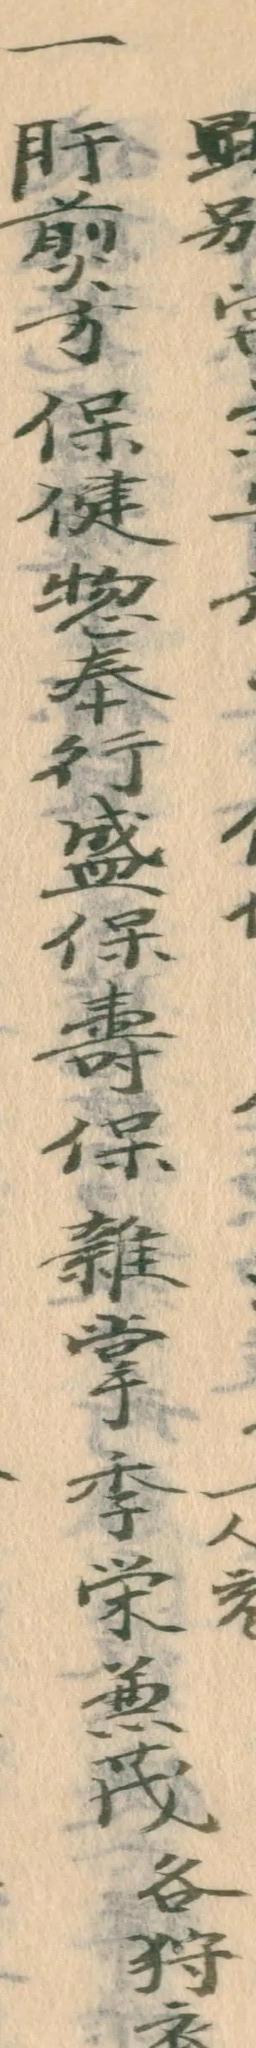一肝煎方保健惣奉行盛保寿保雑掌季栄兼茂各狩衣
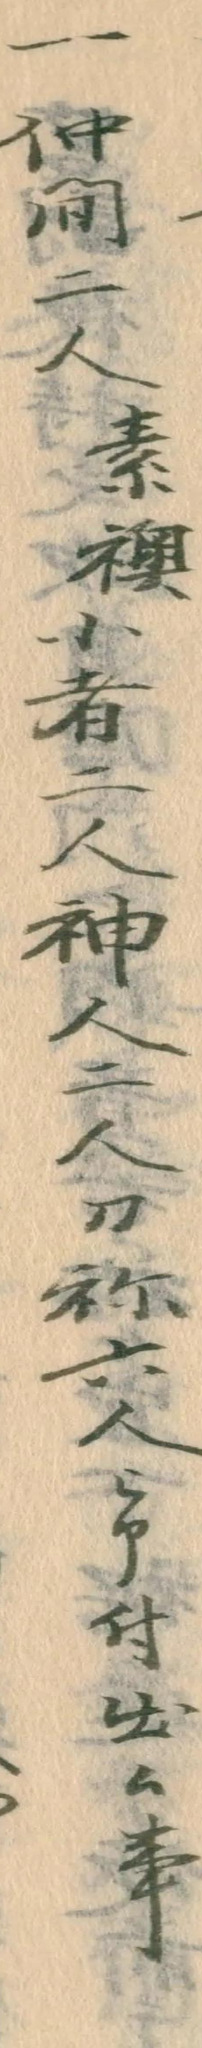一仲間二人素襖小者二人神人二人刀祢六人被申付出候事
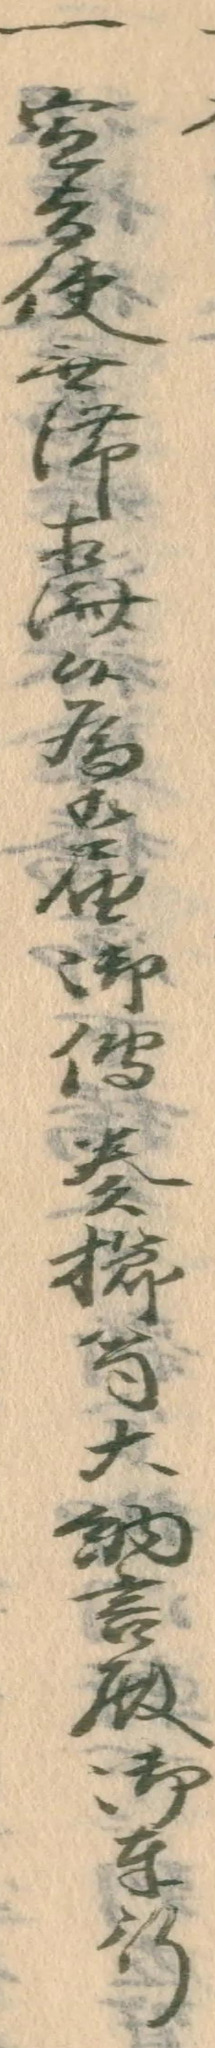一宣旨使無滞相済候為御届御伝奏櫛笥大納言殿御奉行
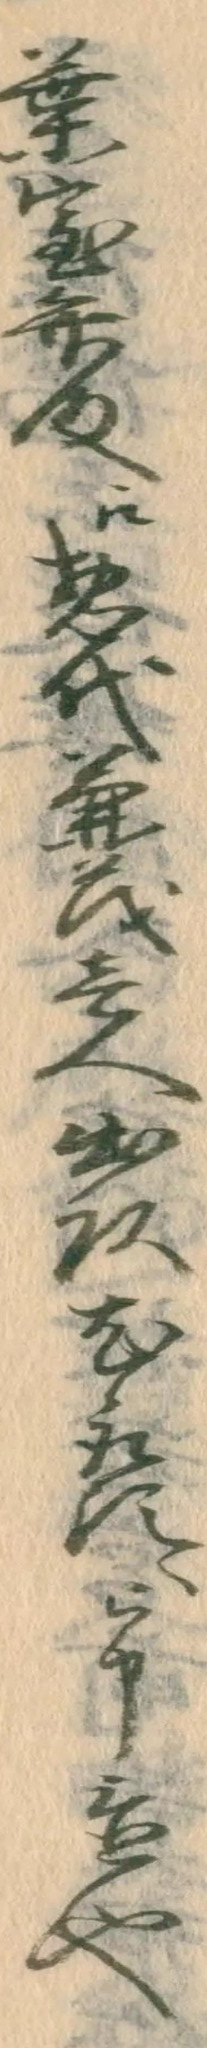葉室弁殿江惣代兼茂壱人出頭尤取次へ被申置也
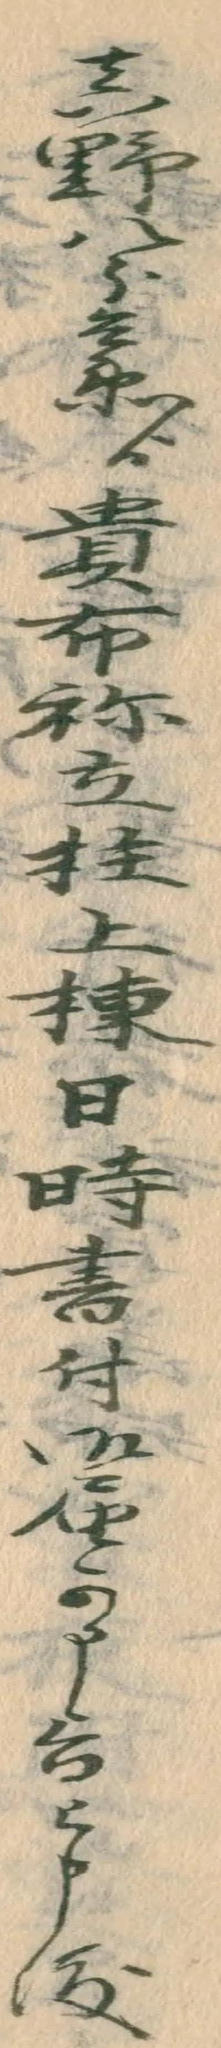一真野八郎兵衛ゟ貴布祢立柱上棟日時書付御届可申旨被申渡
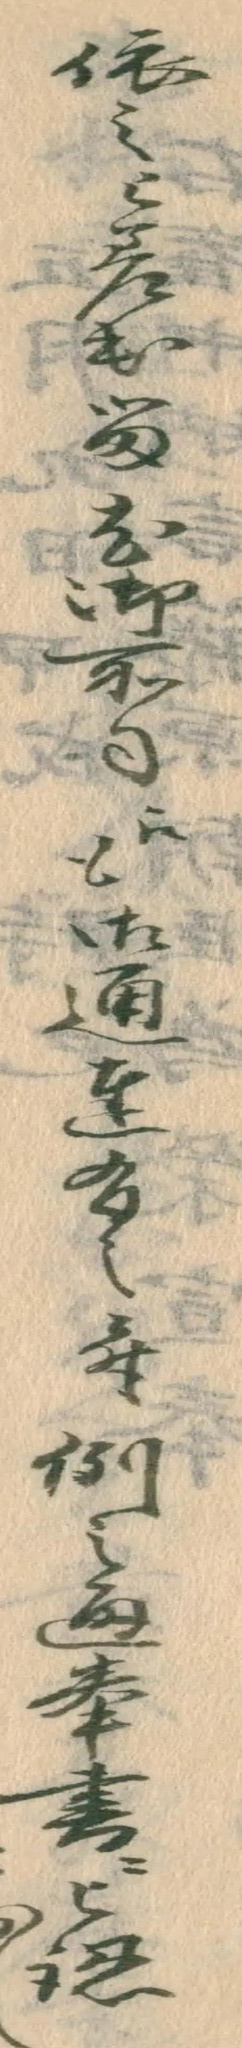依之被差出留尤御所方江も御通達有之ニ付例之通奉書ニ被認被出也
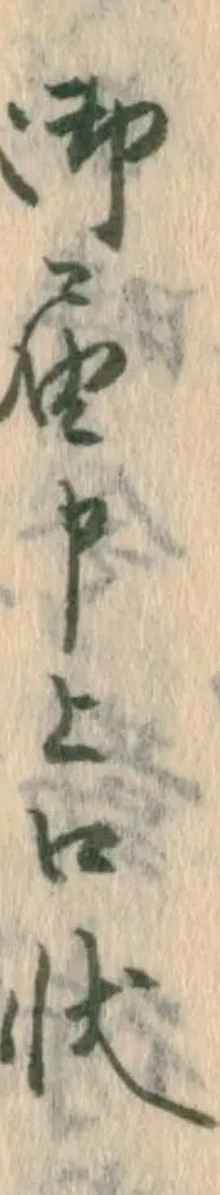御届申上口状
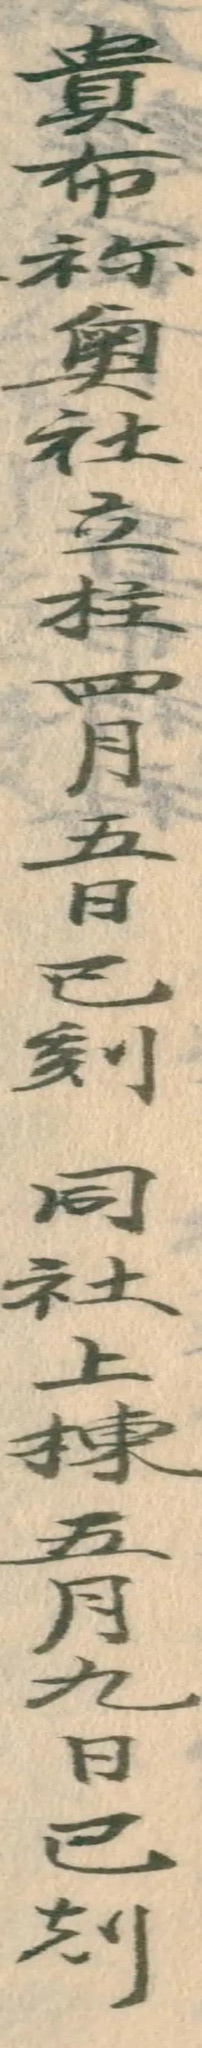貴布祢奥社立柱四月五日巳刻同社上棟五月九日巳刻
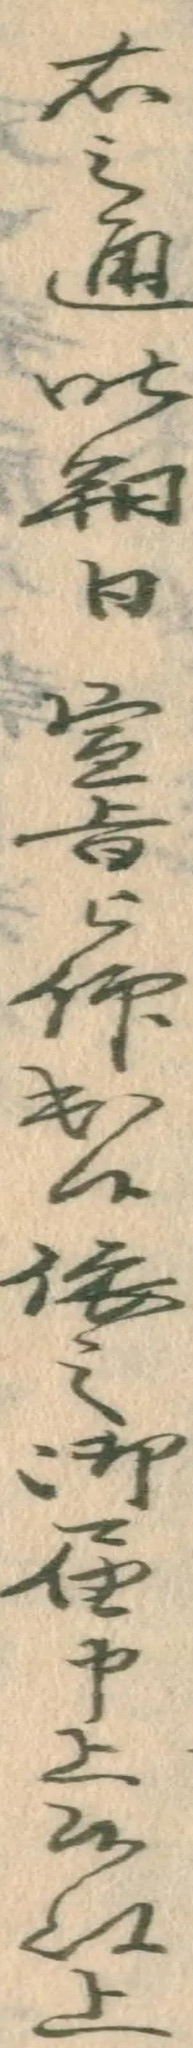右之通昨朔日宣旨被仰出候依之御届申上候以上
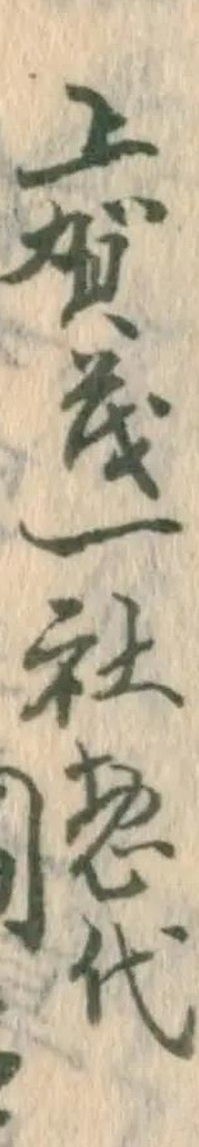上賀茂一社惣代
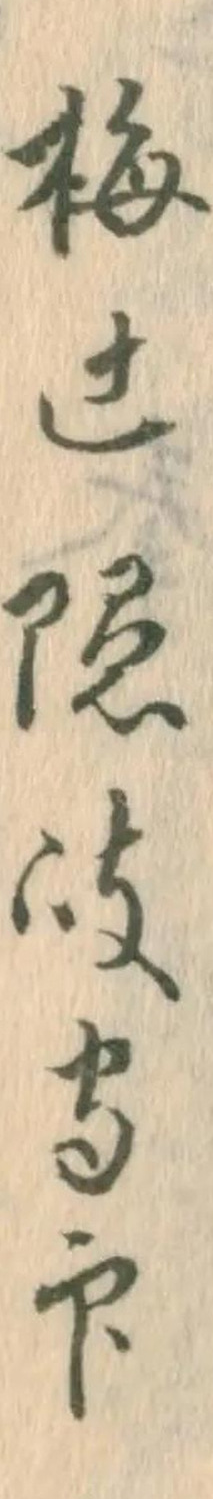梅辻隠岐守印
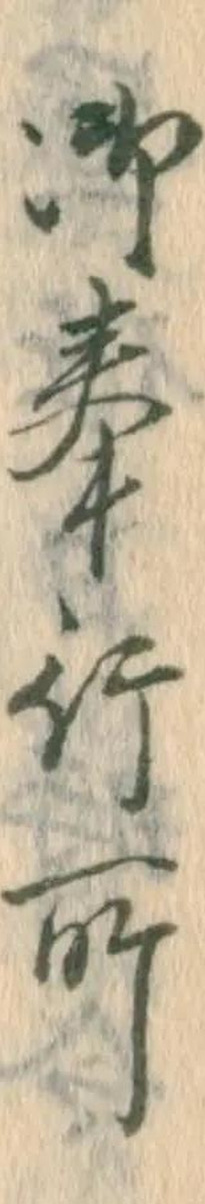御奉行所
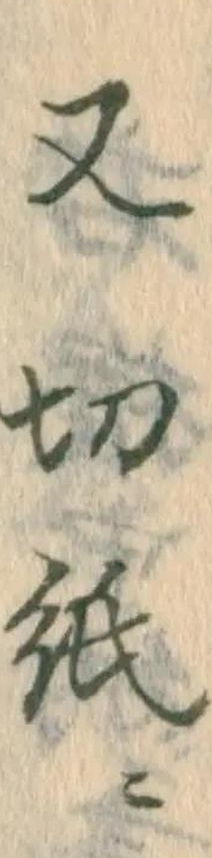又切紙ニ
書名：賀茂社記録. 第17冊
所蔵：国立国会図書館 National Diet Library, JAPAN
